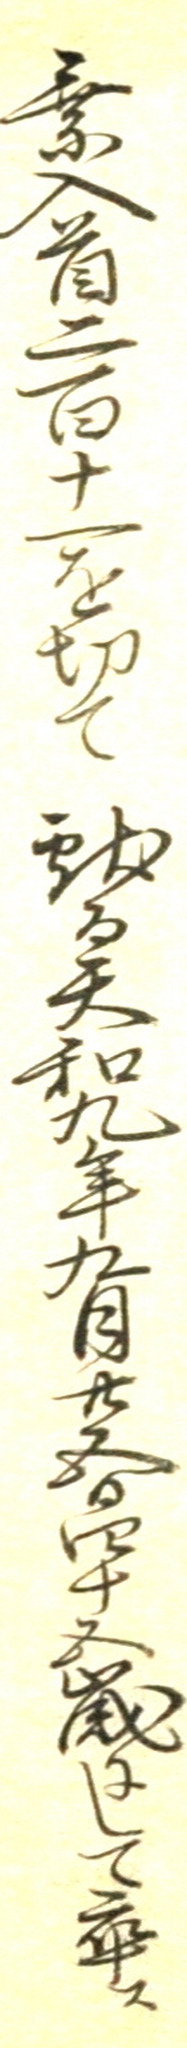乗入首二百十一を切て献る天和九年九月廿五日四十五歳にして卒ス
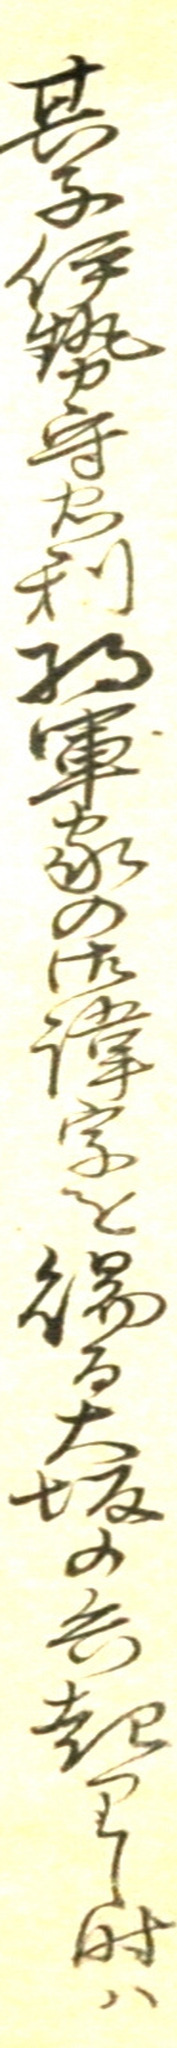其子伊勢守忠利将軍家の御諱字を賜る大坂の兵起りし時は
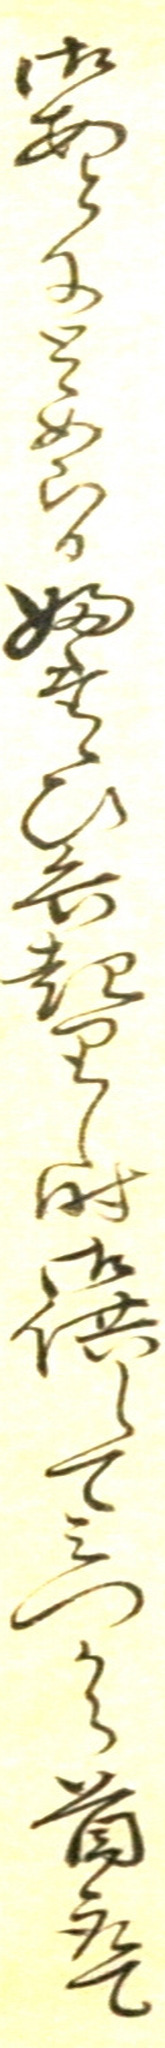御あとにとゝめらるふたゝひ兵起りし時御供してみつから首取て

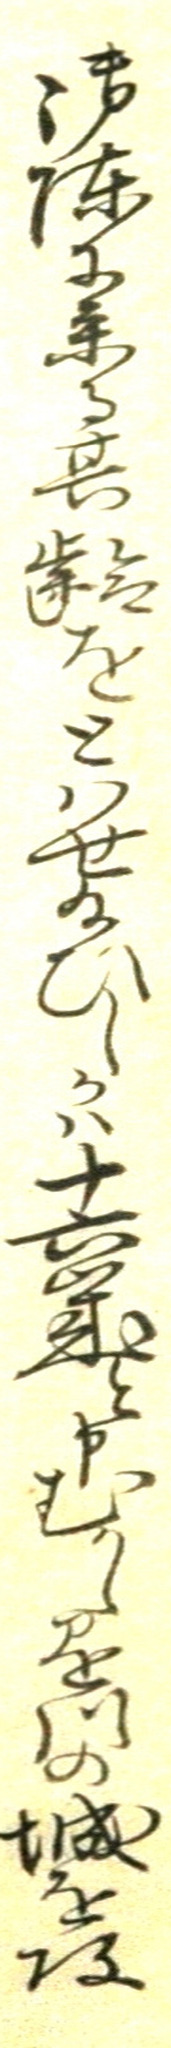御陣に参る其齢をとはせ給ひしかは十六歳と申むかし懸川の城を攻
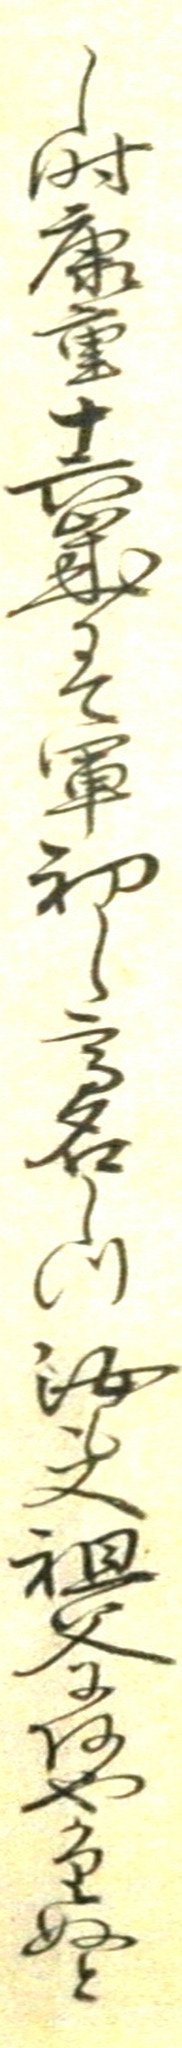し時康重十六歳にて軍初し高名しつ汝も祖父にあやかりぬと
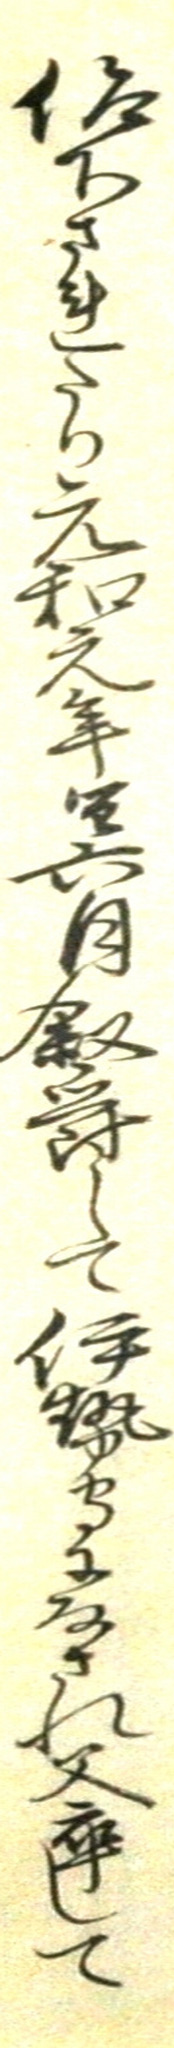仰下されたり元和元年閏六月叙爵して伊勢守になされ父卒して
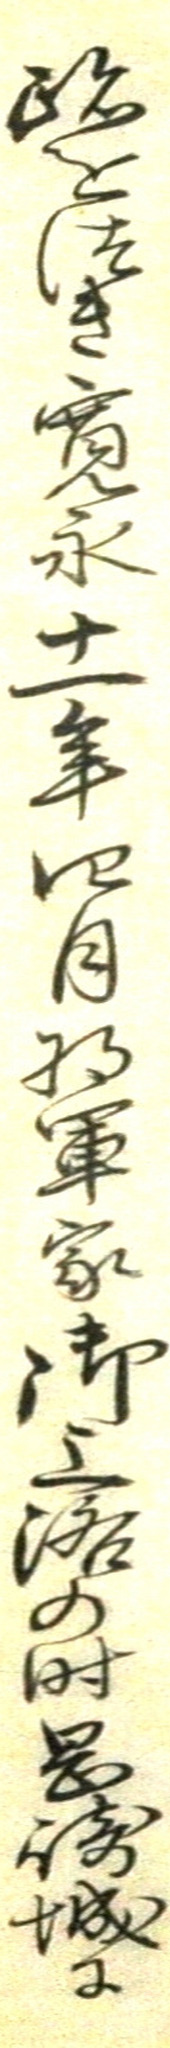跡をつき寛永十一年四月将軍家御上洛の時岡崎城に
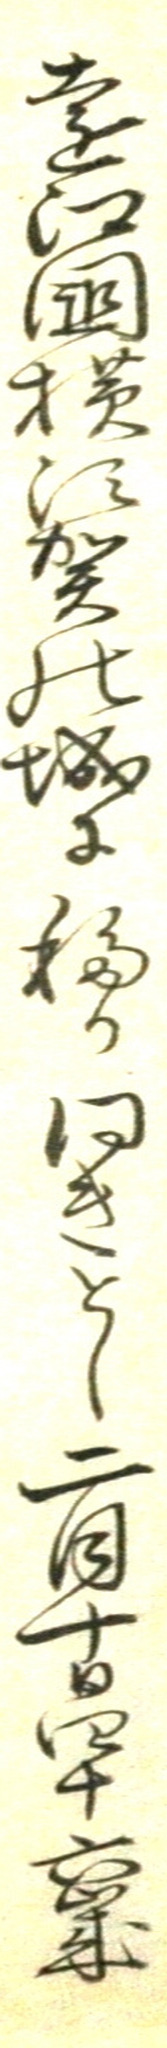遠江国横須賀の城に移り同きとし二月十日四十六歳
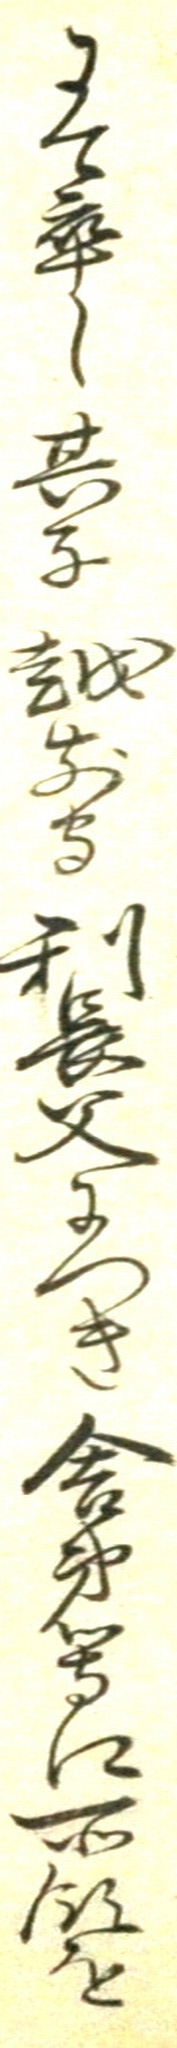にて卒し其子越前守利長父につき舎弟等に所領を
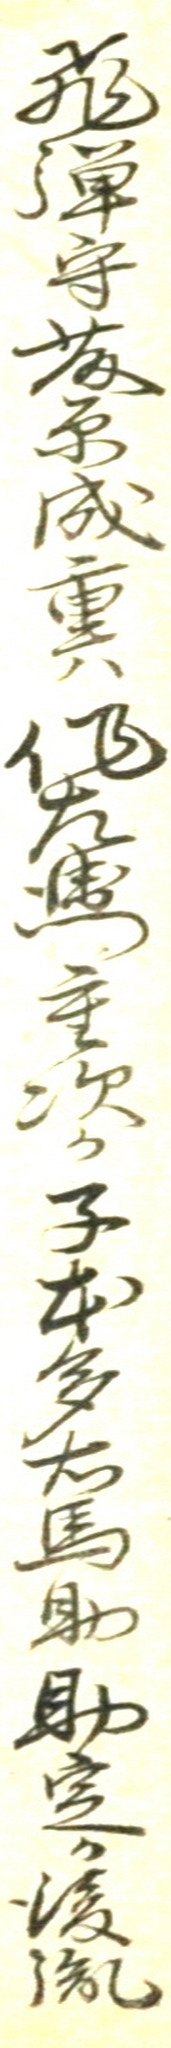飛騨守藤原成重は作左衛門重次か子本多右馬助助定か後胤
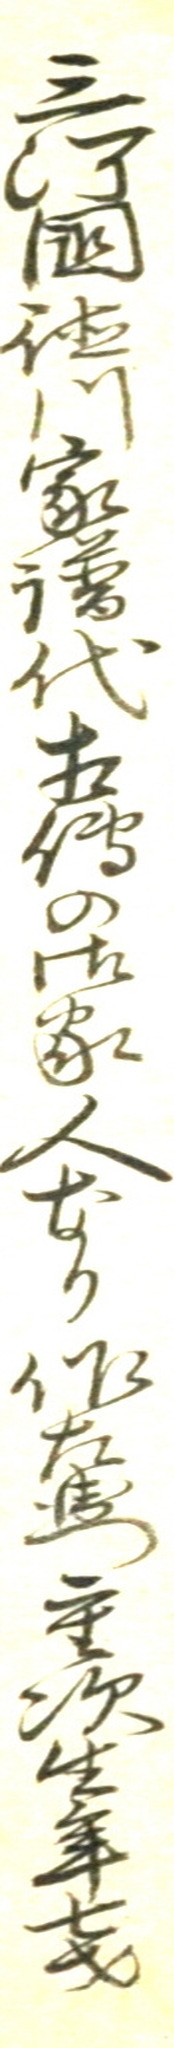三河国徳川家普代相伝の御家人なり作左衛門重次生年七才
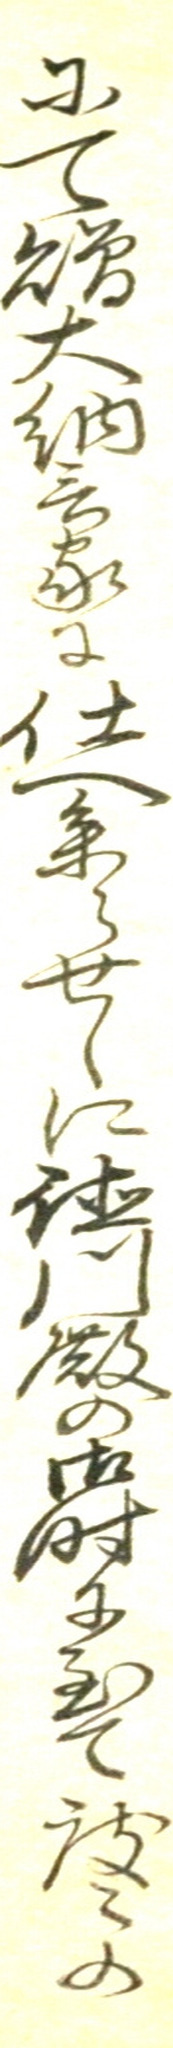にて贈大納言家に仕へ参らせしに徳川殿の御時に至て度々の
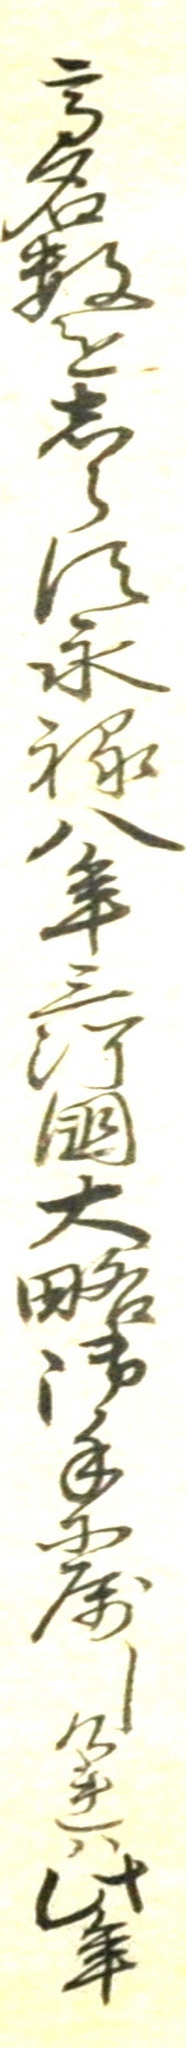高名数をしらす永禄八年三河国大略御手に属しけれは此年
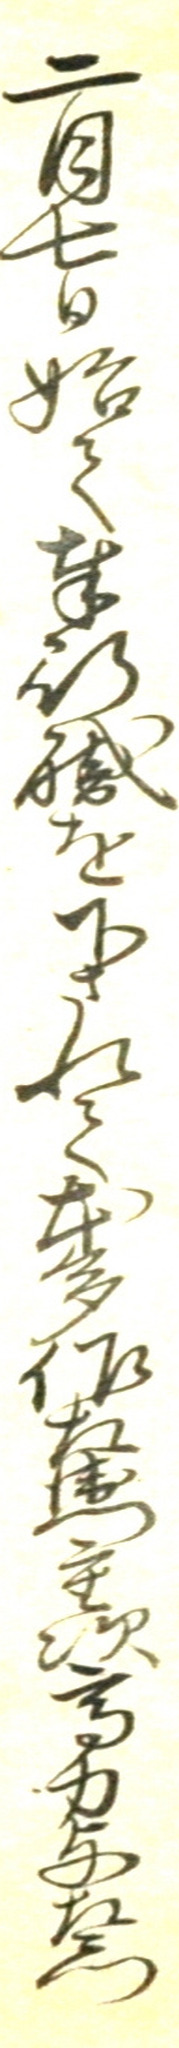二月七日始て奉行職を下されて本多作左衛門重次高力与左ヱ門
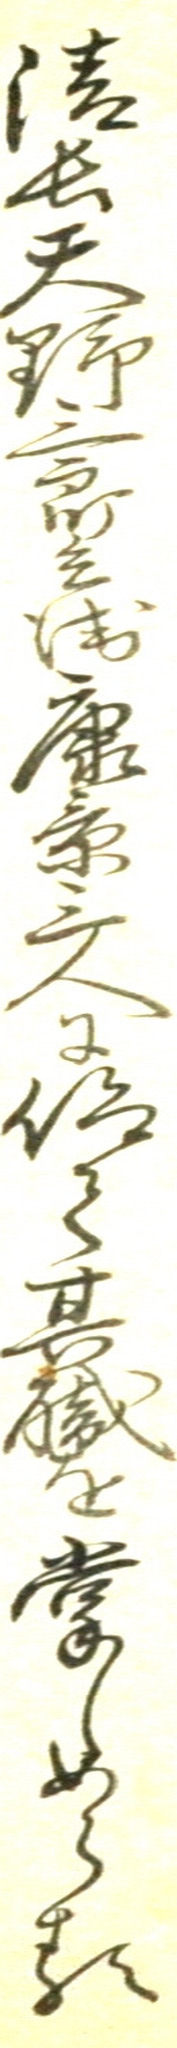清長天野三郎兵衛康景三人に仰て其職を掌しめらる
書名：藩翰譜（四・上）
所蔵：伊那市立高遠町図書館・合同会社AMANE
